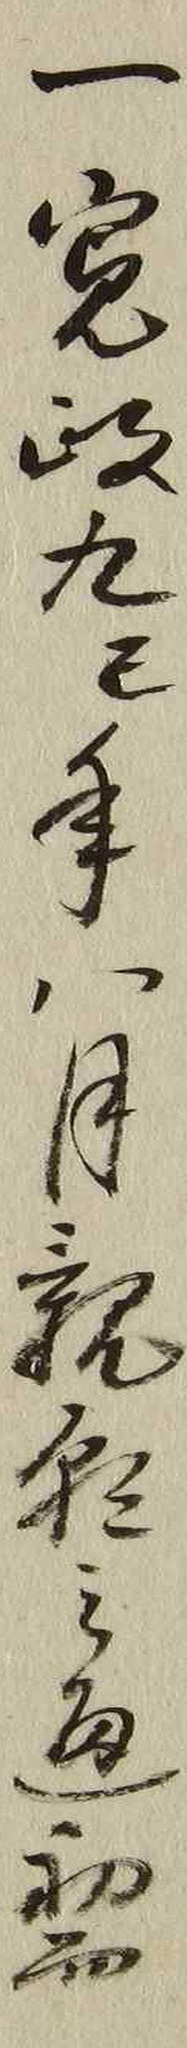一寛政九巳年八月親願之通初而
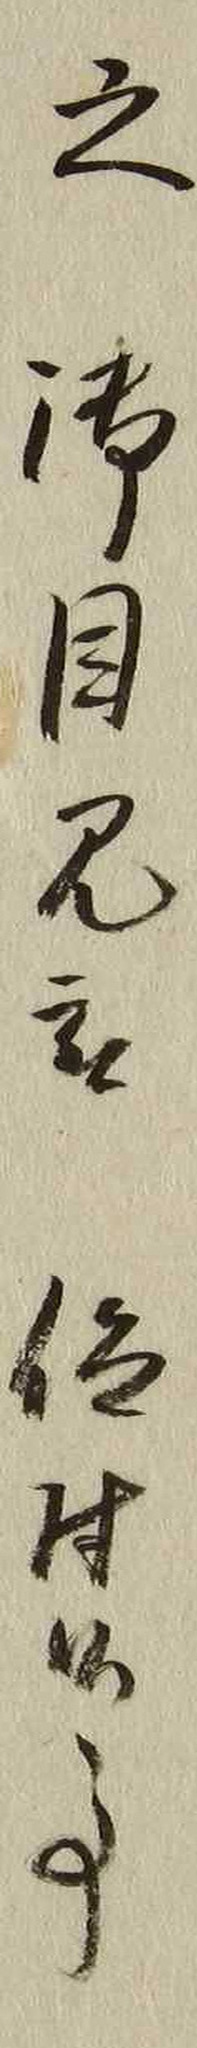之御目見被仰付候事
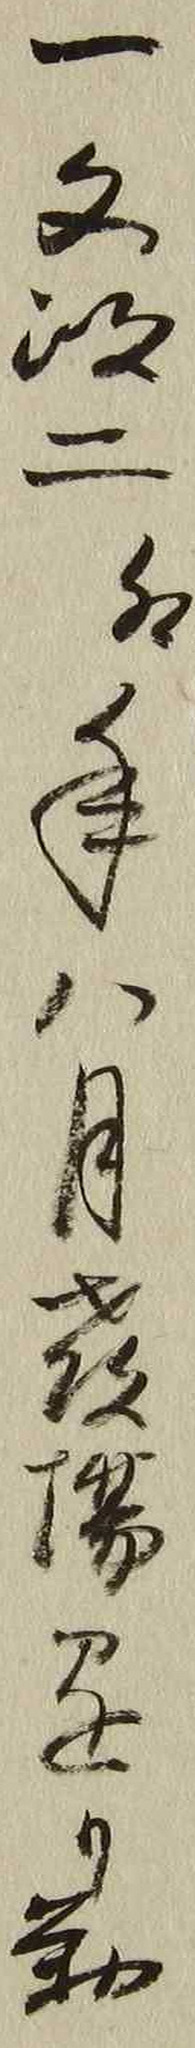一文政二卯年八月教場懸り勤
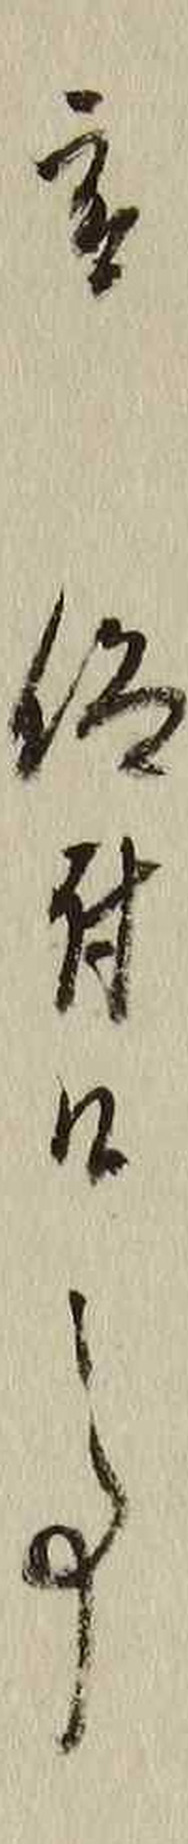被仰付候事
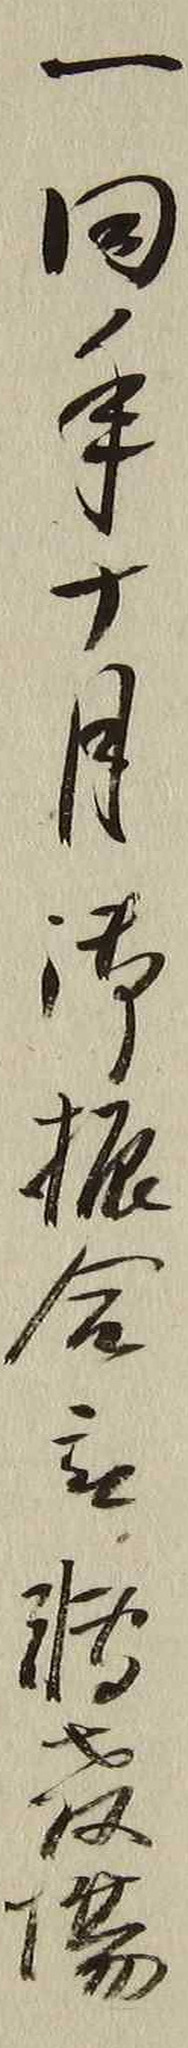一同年十月御振合被転教場
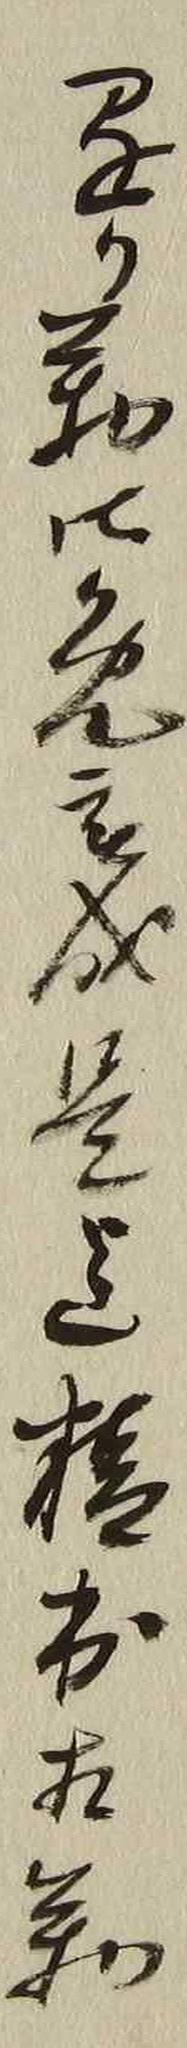懸り勤御免被成是迄精出相勤
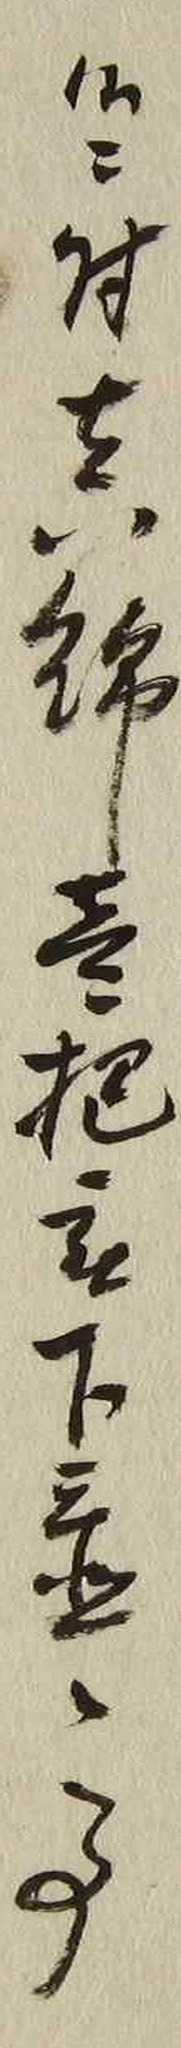候ニ付真綿壱把被下置候事
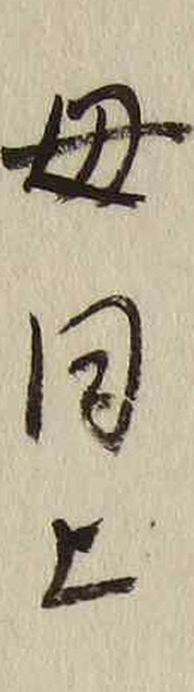母同上

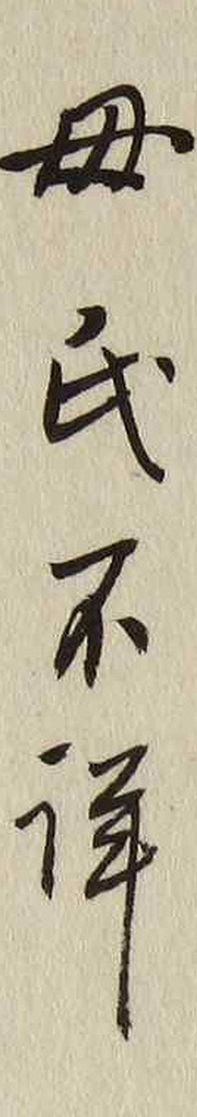母氏不詳
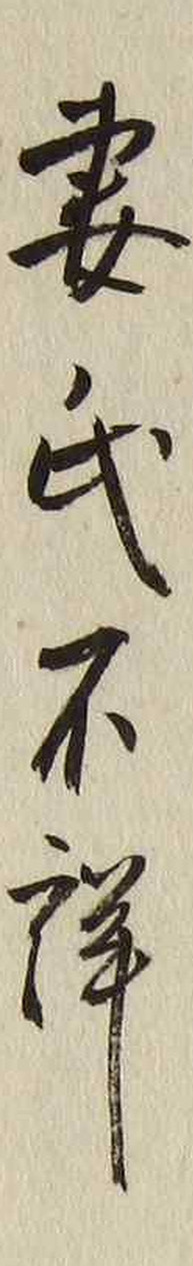妻氏不詳
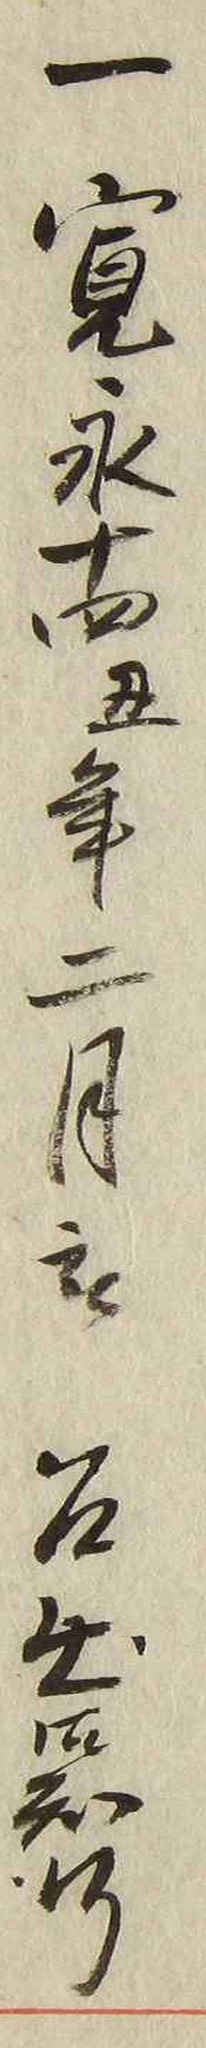一寛永十四丑年二月被召出御知行

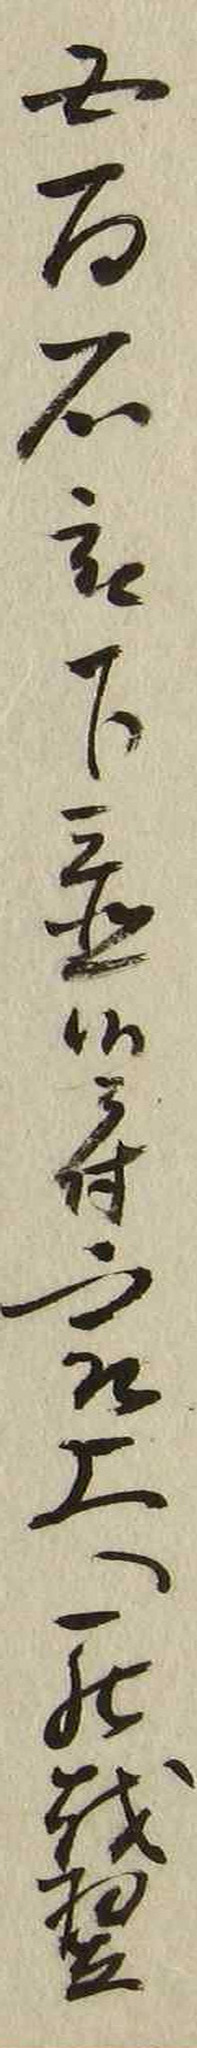五百石被下置候ニ付最上へ罷越翌
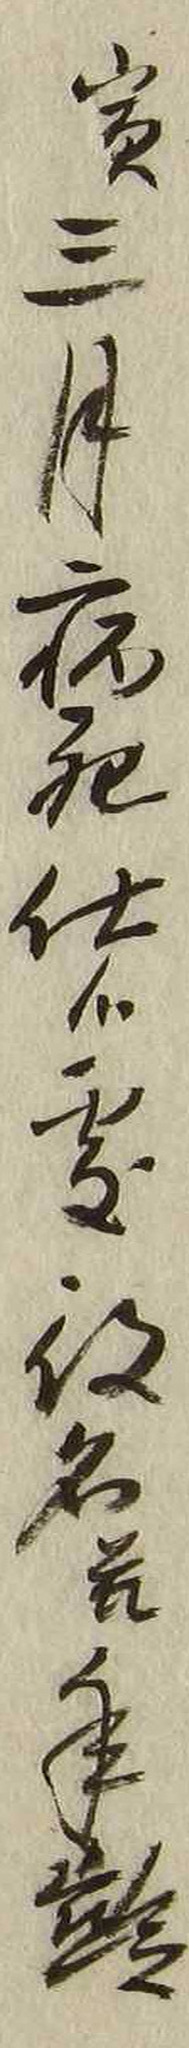寅三月病死仕候処役名并年齢
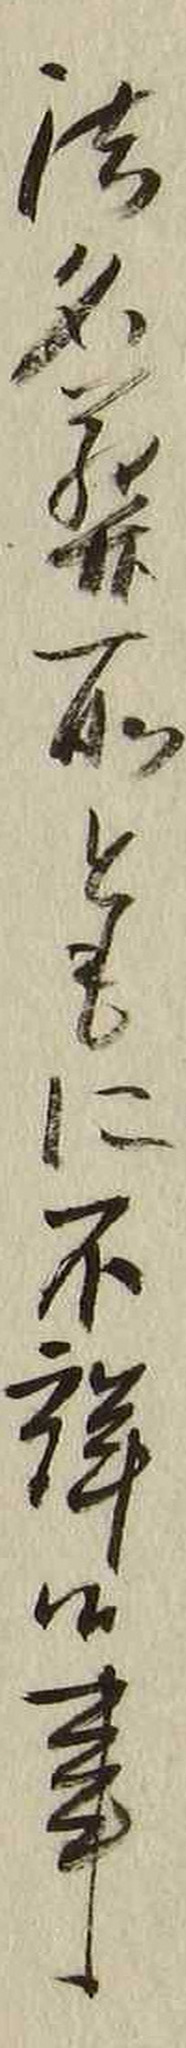法名葬所ともに不詳候事
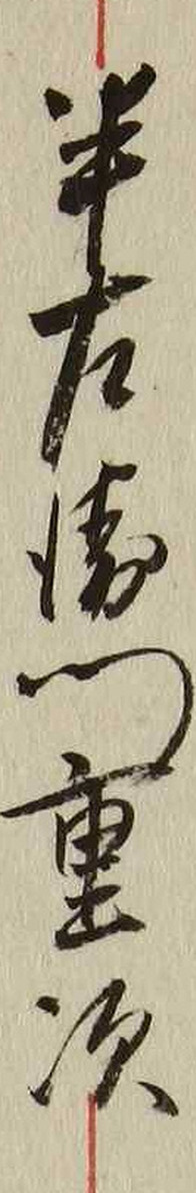半左衛門重次
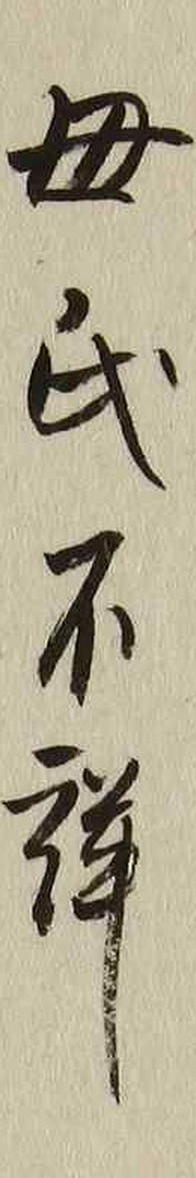母氏不詳
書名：諸士系譜　巻之355　す之部5
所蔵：会津若松市立会津図書館
